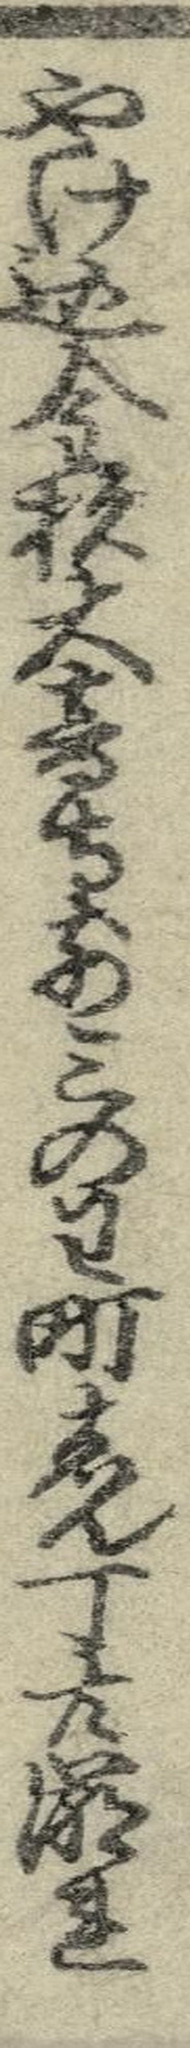やけ込金杉大音寺前ミのわ町しん丁は崩れ
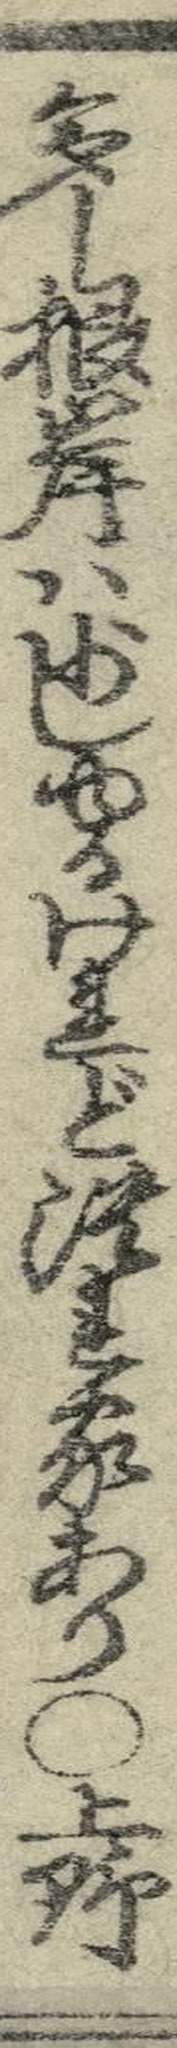多し根岸ハ少しゆるけれど潰れ家あり〇上野
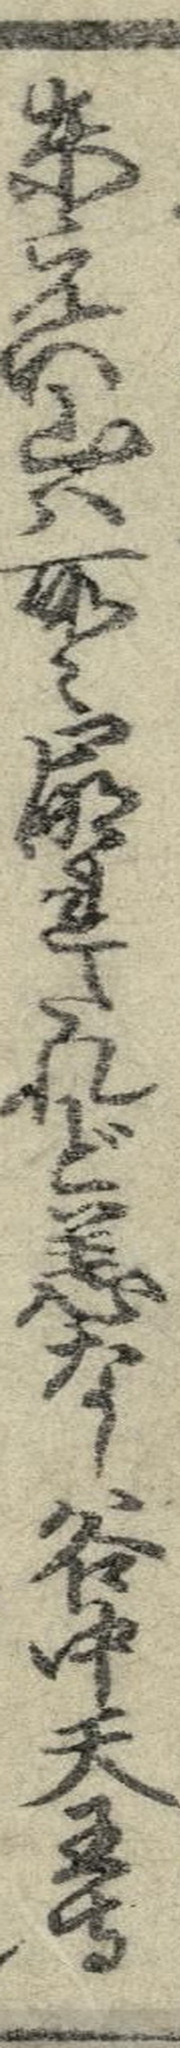東えい山ハ所〻崩れたれど恙なし谷中天王寺
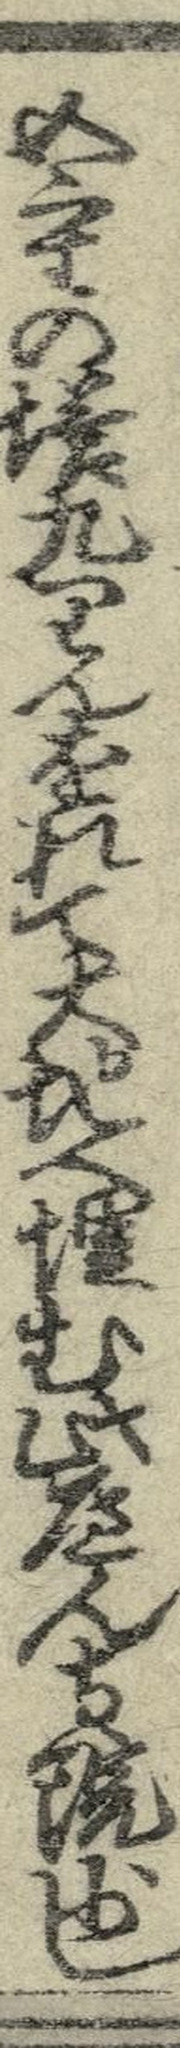五重の塔ハ九りんをれて大地へ埋む此邊へん寺院少し
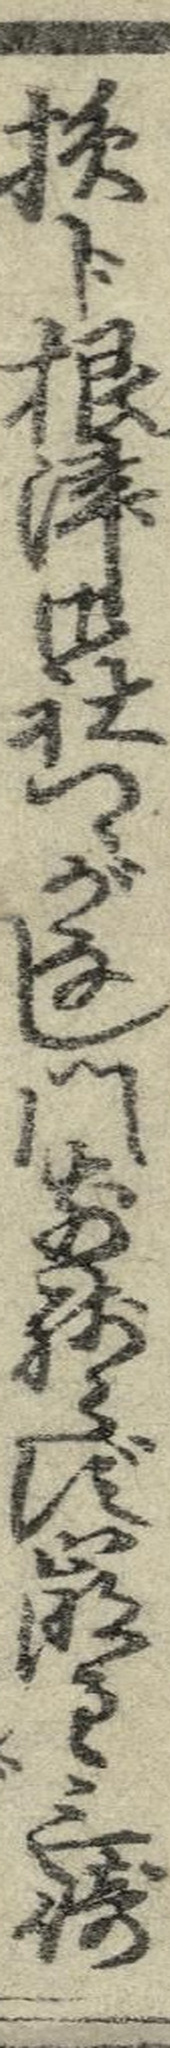損じ根津御社つゝがなし門前殘らず崩る三崎
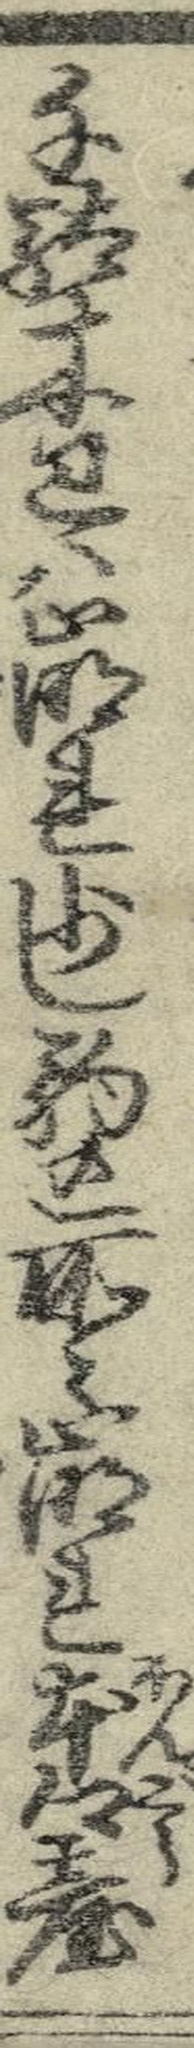千駄木邊ハ崩れ少し駒込所〻崩れ本郷モ藏
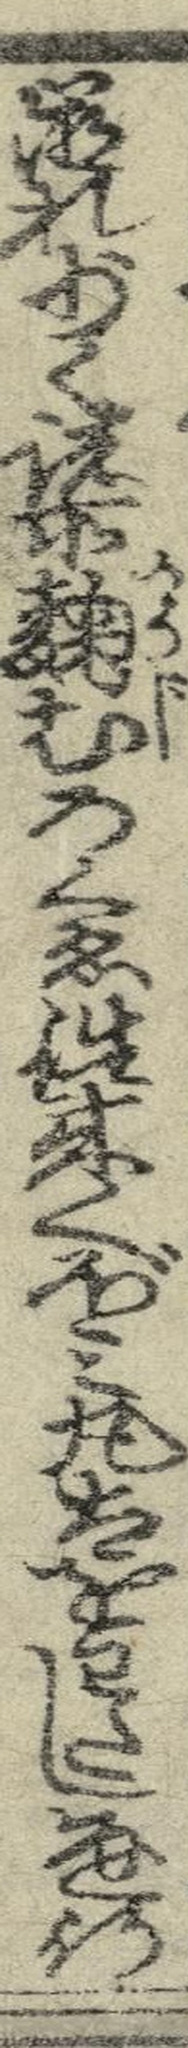崩れ少く諸所麴むろくゑ徃來くぼミ丸太をわたし道行
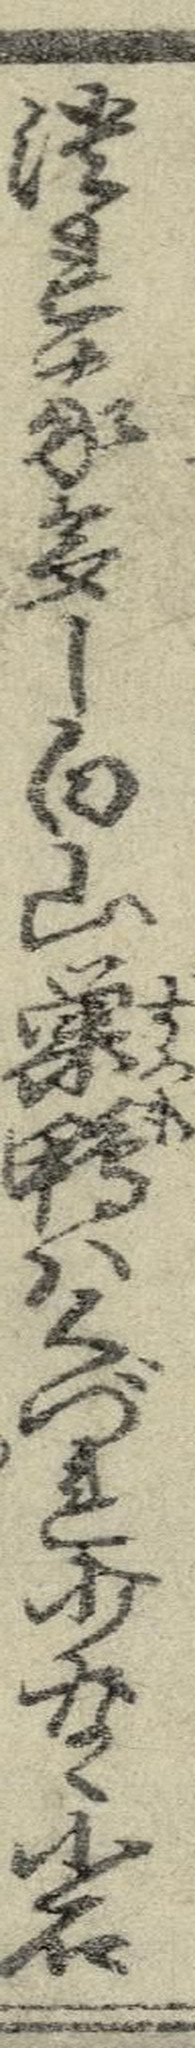潰れ家多し白山巣鴨ハくづれ少なく小石
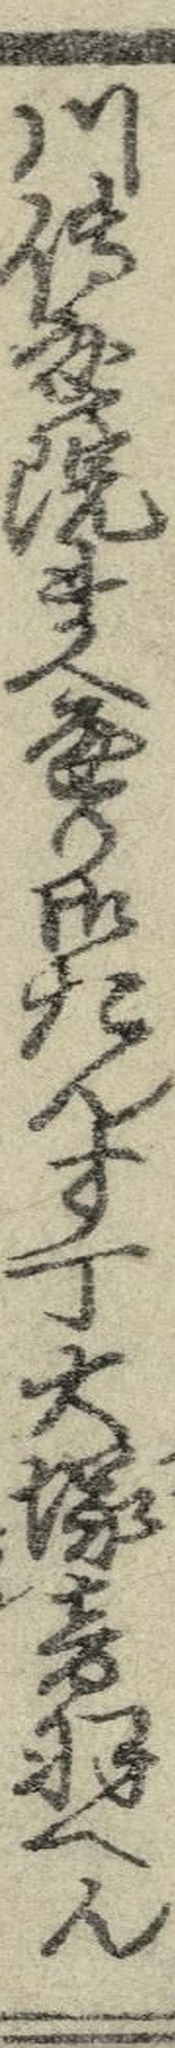川傳通院まへ通り御たんす丁大塚音羽へん
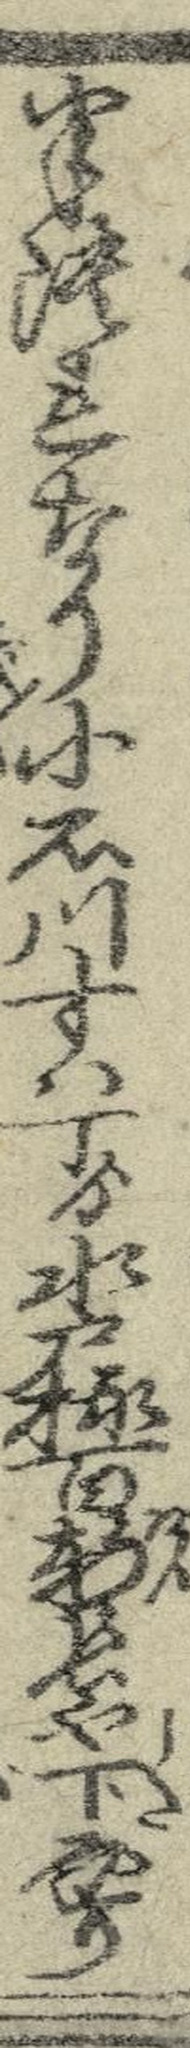半潰れなり小石川すハ丁ゟ水戸樣百軒長や下通り
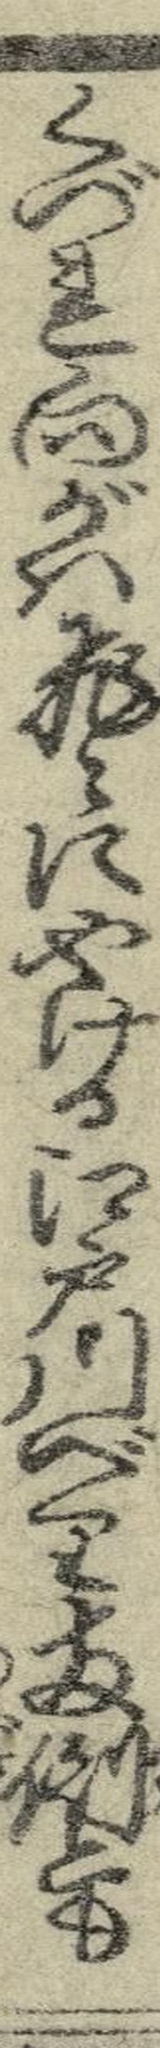くづれ向がハ飛〻にやける江戸川べり兩側とも
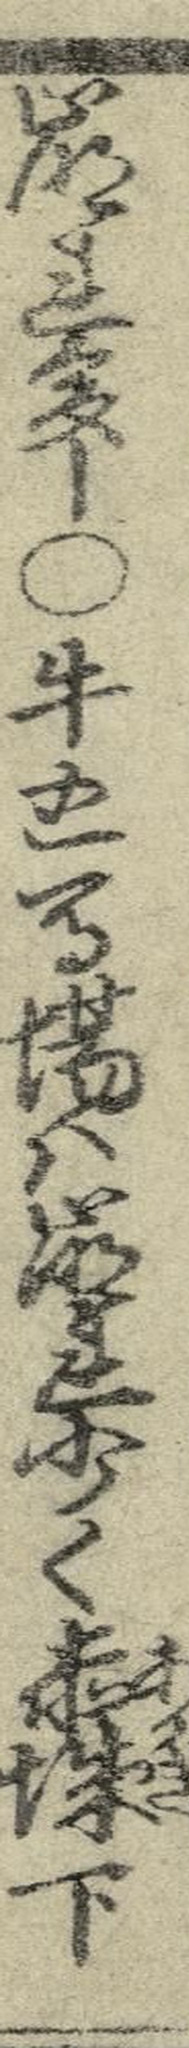崩れ多し〇牛込馬場ハ崩れ少く赤城下
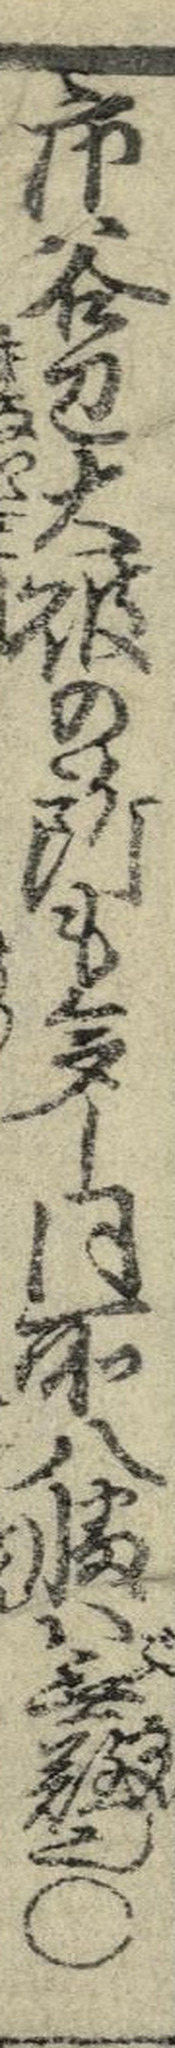市谷邊大破の所も多し同所八幡ハ無難也○
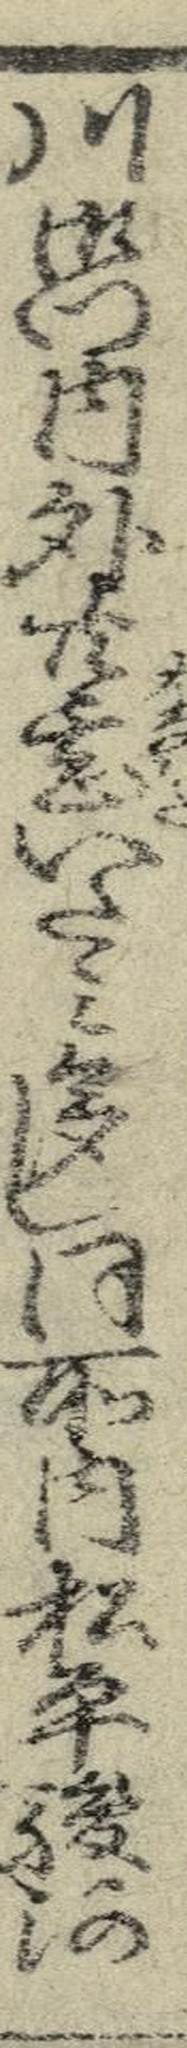川御門内外共甚いたみ多し同所内松平駿河
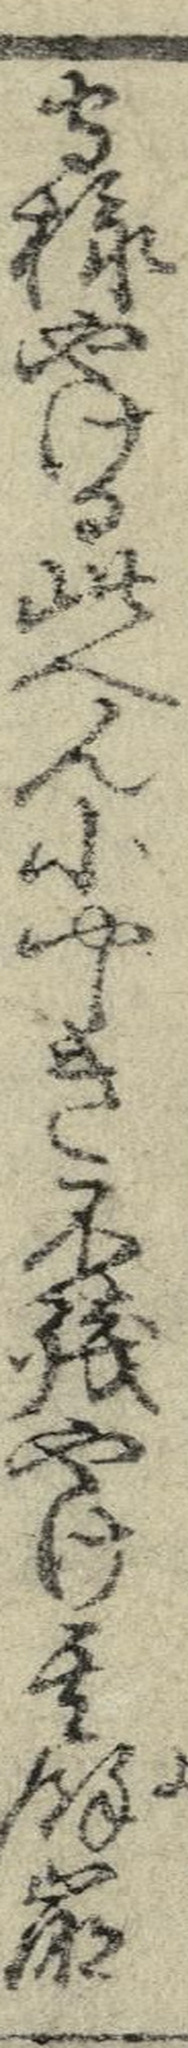守様やける此へんにやしき不残やけ其餘崩
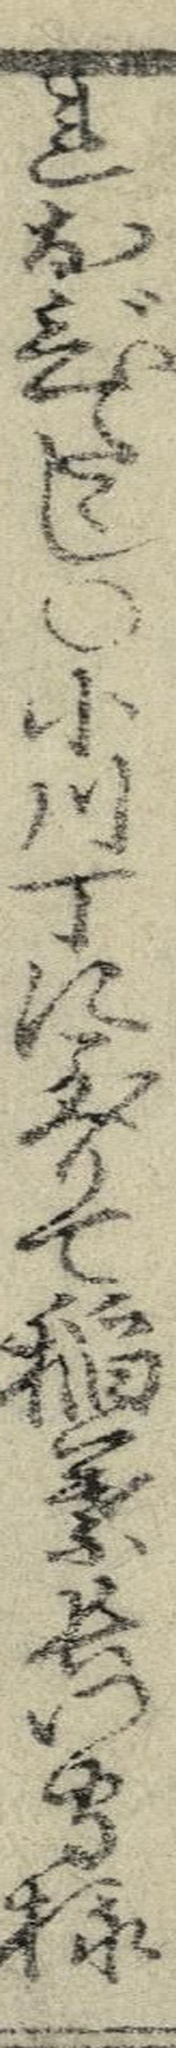れおびたゞし〇小川丁に至りて稲葉長門守様
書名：地震並出火細見記
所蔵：東京大学地震研究所図書室 Earthquake Research Institute Library, The University of Tokyo, JAPAN
